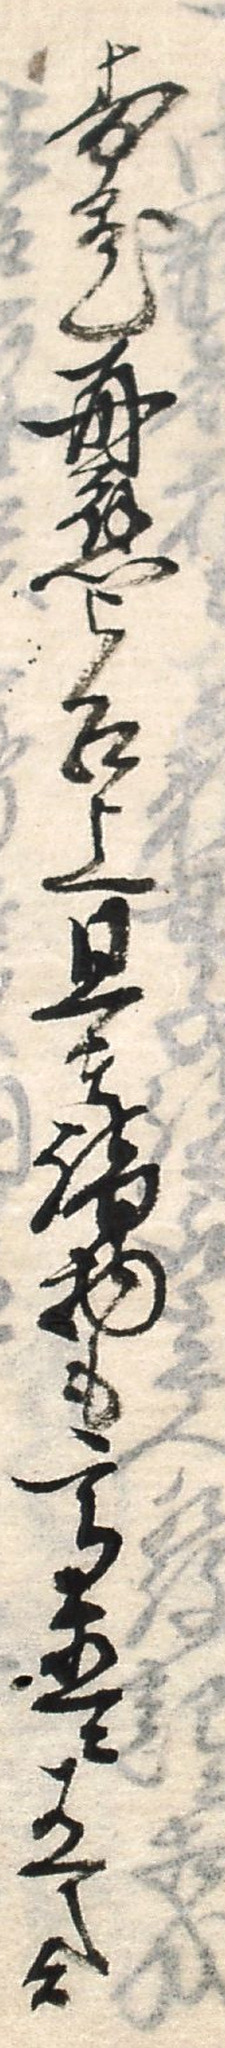歩懸再応被召上且は諸物も高直に有之候
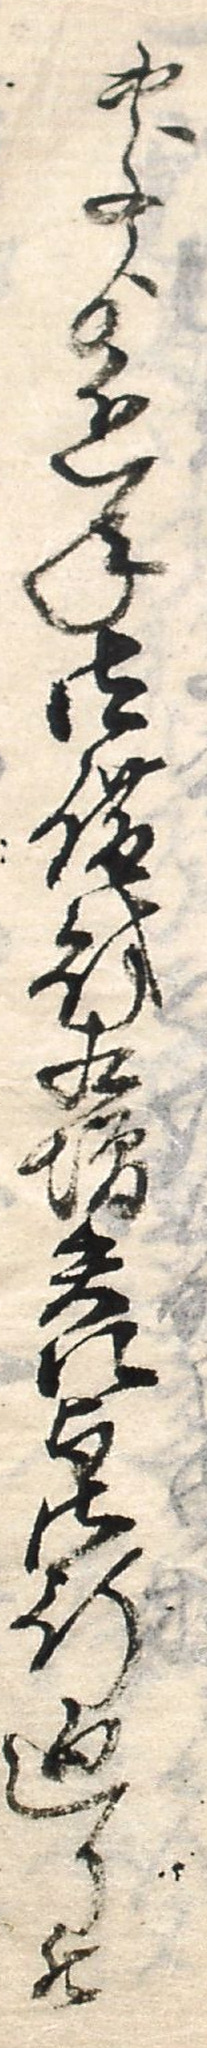処ゟ近年御借財相増犇与仕行迫り被
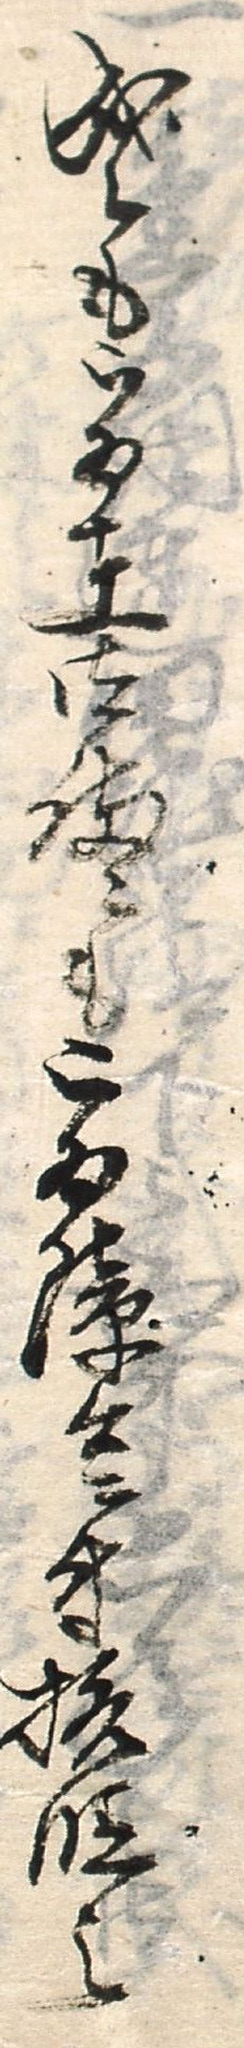成候も被為在御備にも被為障候に付格段之
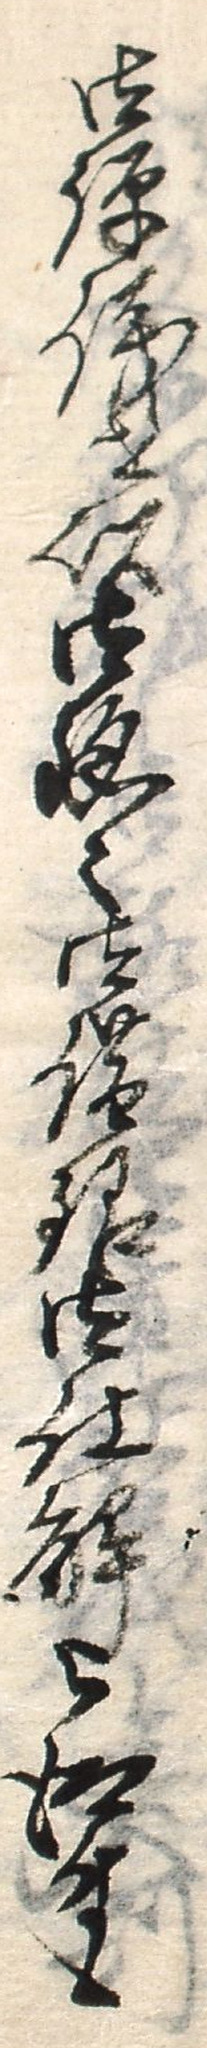御評儀を以御銘々御借銀御仕解被仰付候
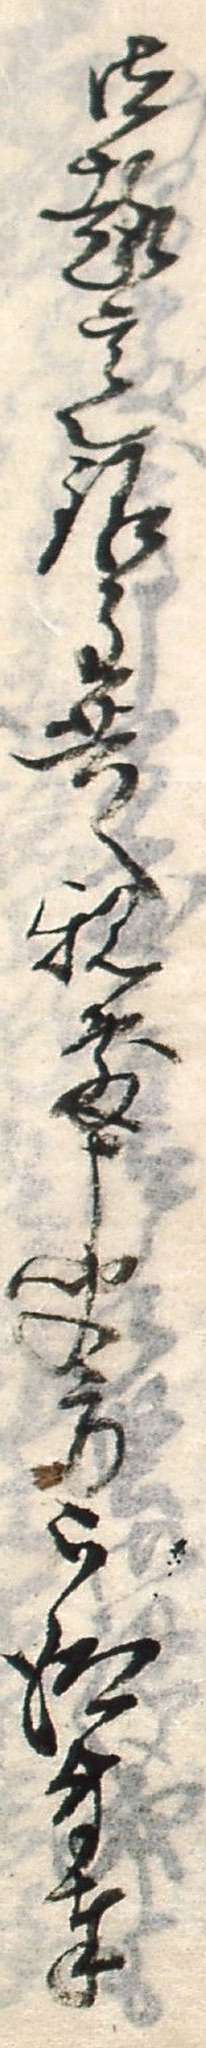御趣意銀主共へ親敷申聞方被仰付奉
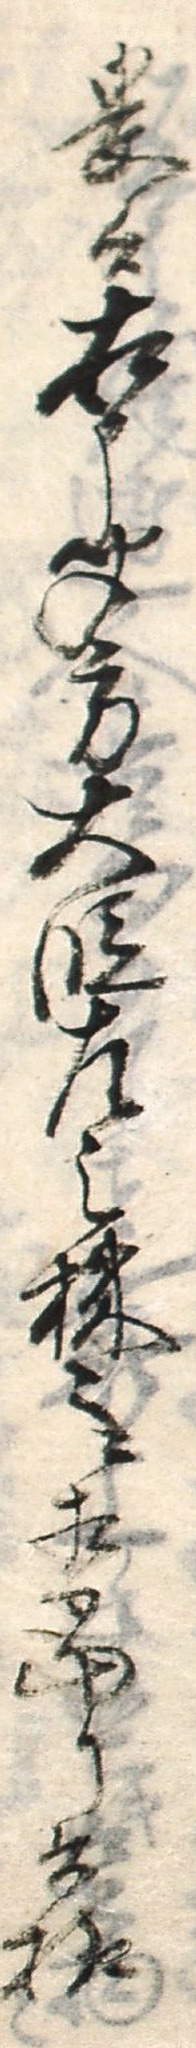畏候右申聞方大段左之株々に相当り候様
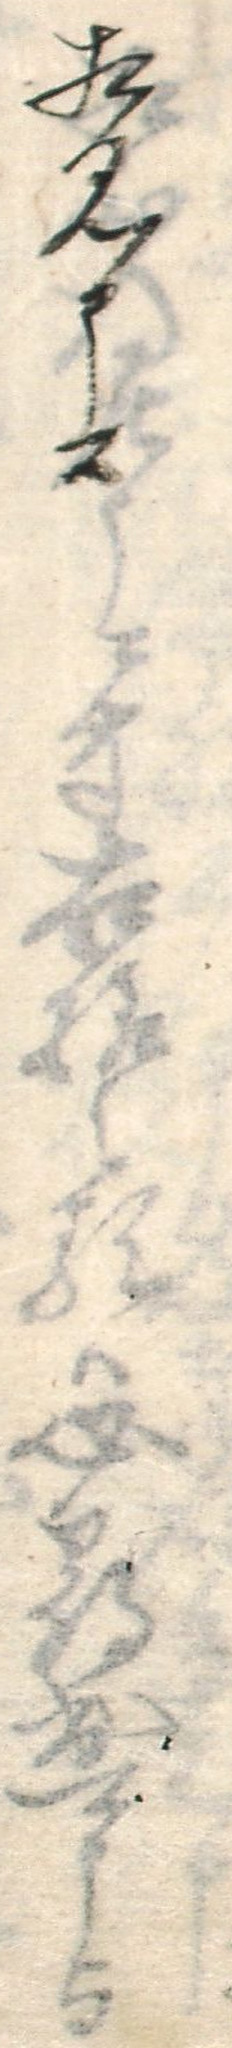相見申候
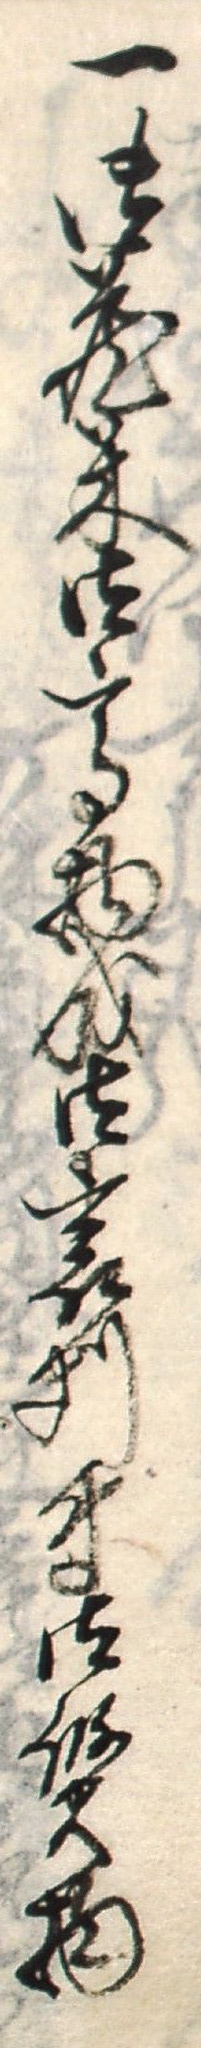一御蔵米御高物成御裏判付御質物
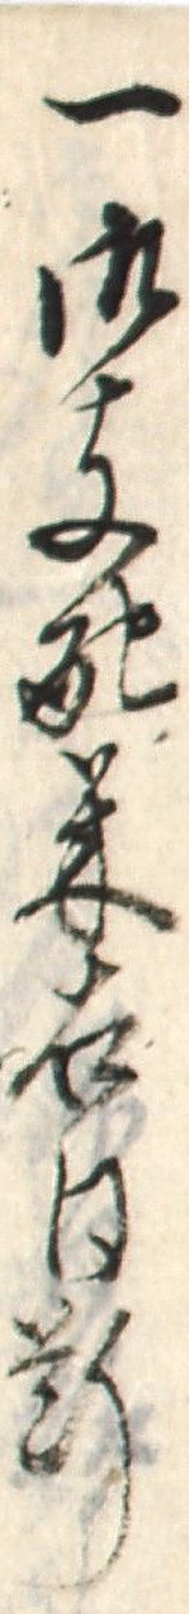一御支配米右同断

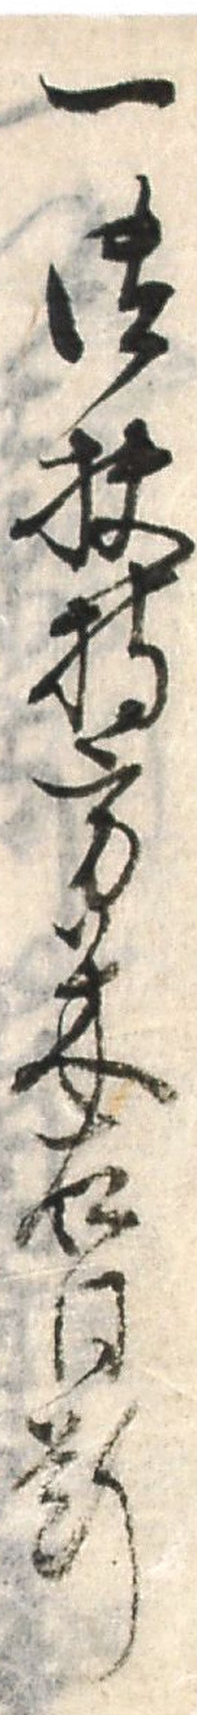一御扶持方米右同断
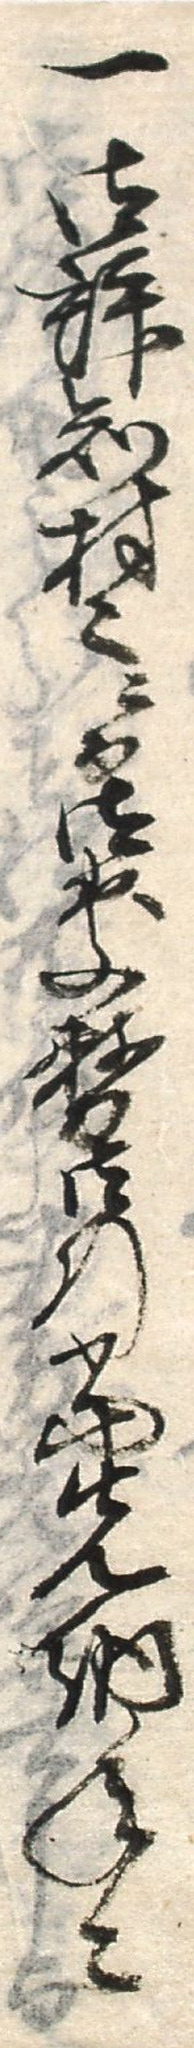一御拝知村々に而御処務御引当先納年々
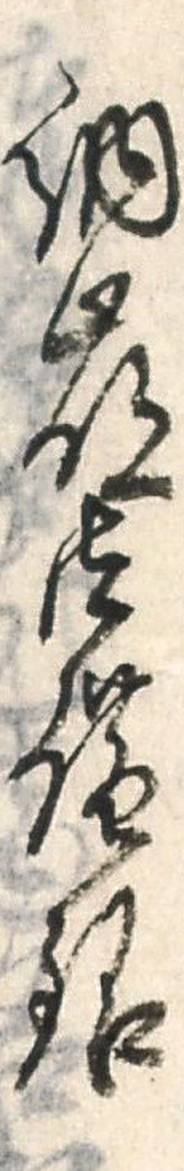納崩御借銀
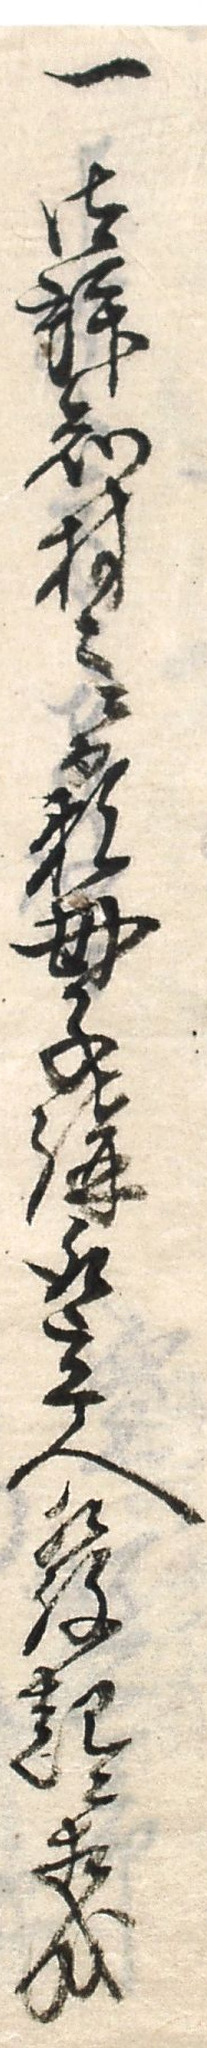一御拝知村々に而頼母子講取立人発役起に相成
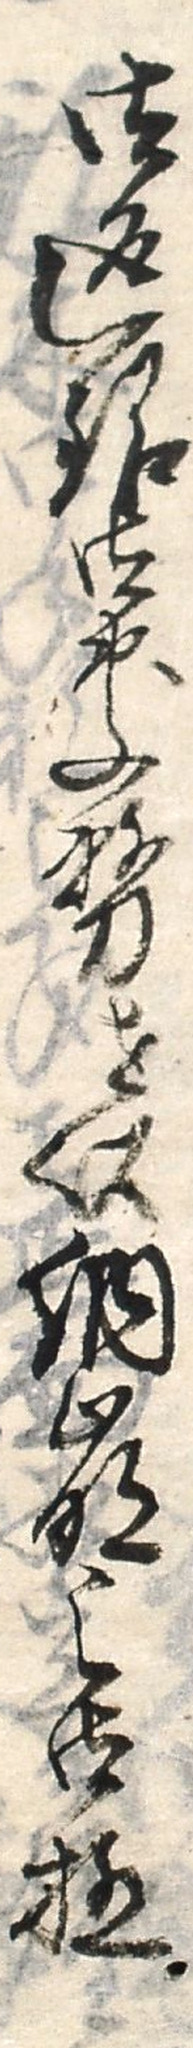御返銀御処務を以納崩之御極
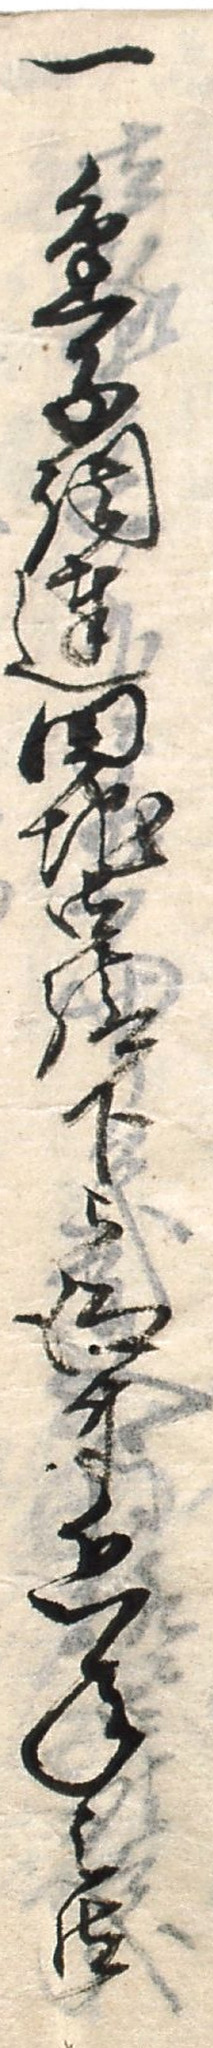一金子調達田地御請下被仰付近年之
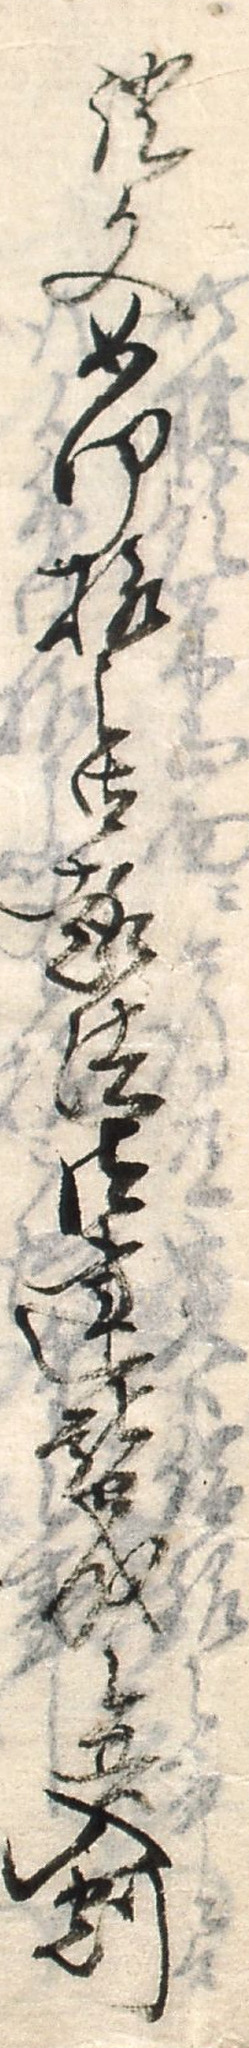証文如何様之御趣法御建替成候共入割
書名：御家中并無格御奉公人借銀御仕解一件御書付写其余共控
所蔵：鳴門教育大学 Naruto University of Education
